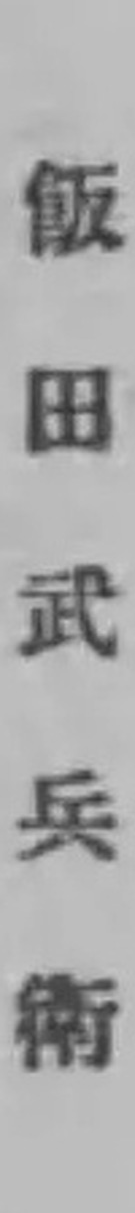飯田武兵衛
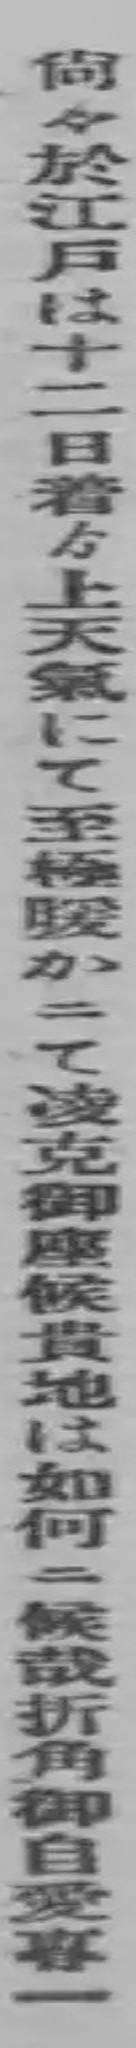尚々於江戸は十二日着ゟ上天気にて至極暖かニて凌克御座候貴地は如何ニ候哉折角御自愛専一
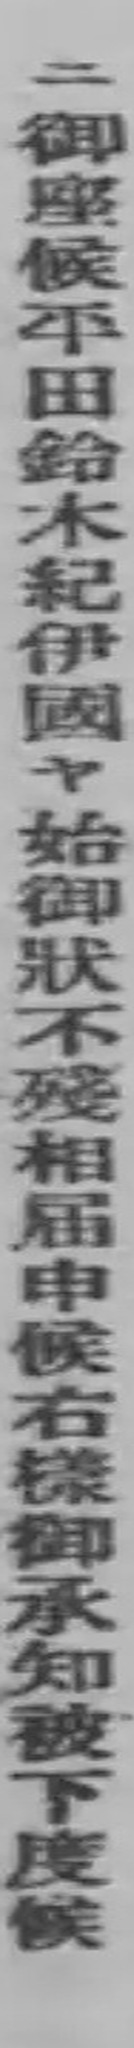ニ御座候平田鈴木紀伊国ヤ始御状不残相届申候右様御承知被下度候
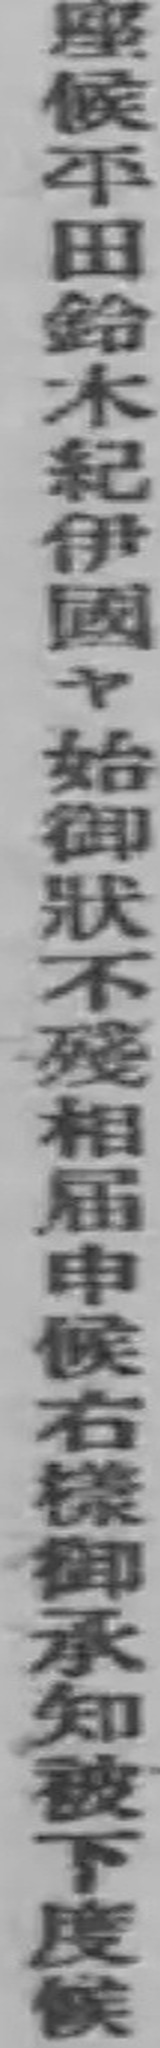ニ御座候平田鈴木紀伊国ヤ始御状不残相届申候右様御承知被下度候
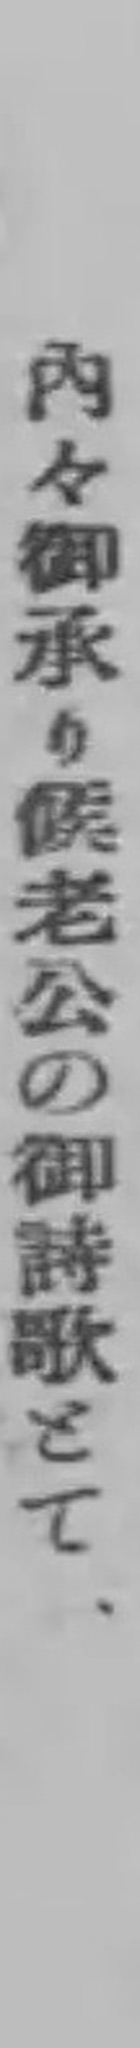内々御承り候老公の御詩歌とて
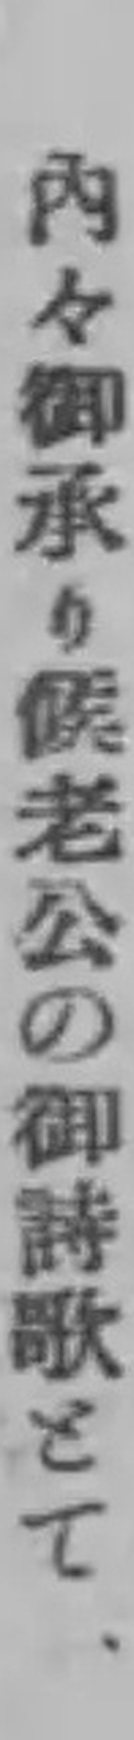内々御承り候老公の御詩歌とて
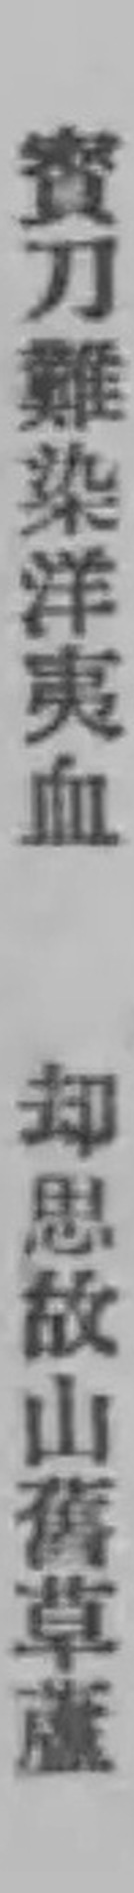宝刀難染洋夷血却思故山旧草蘆
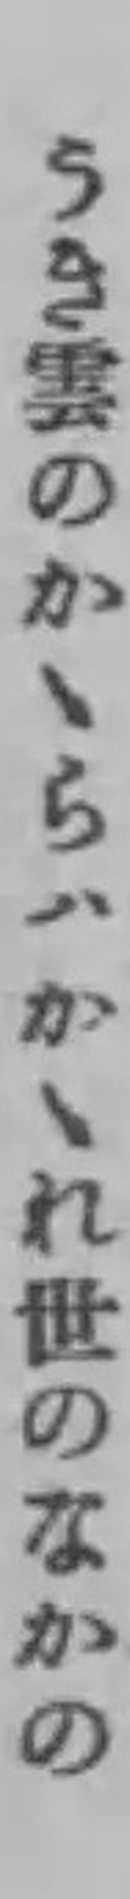うき雲のかゝらはかゝれ世のなかの
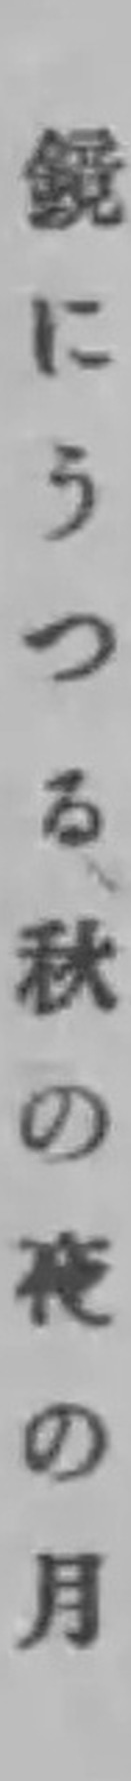鏡にうつる秋の夜の月
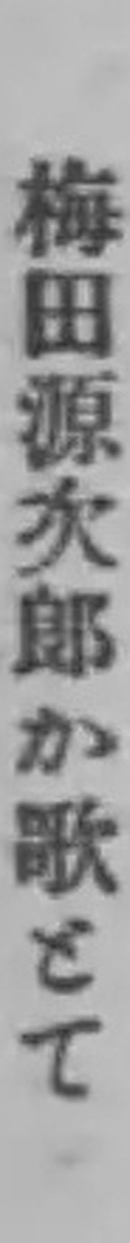梅田源次郎か歌とて
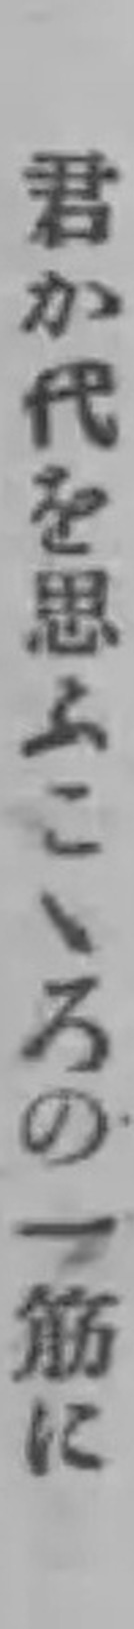君か代を思ふこゝろの一筋に

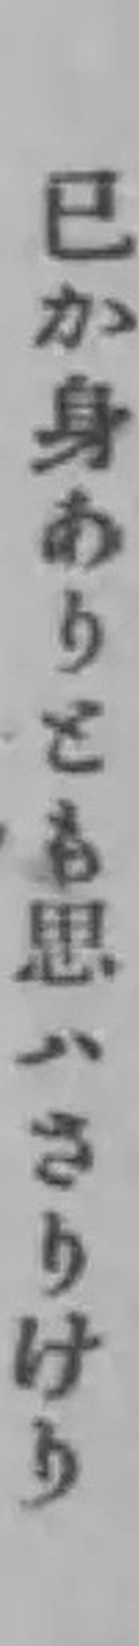巳か身ありとも思はさりけり
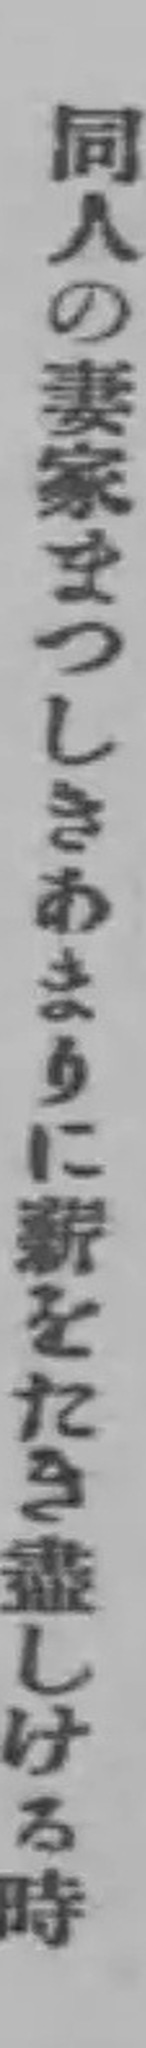同人の妻家まつしきあまりに薪をたき盡しける時
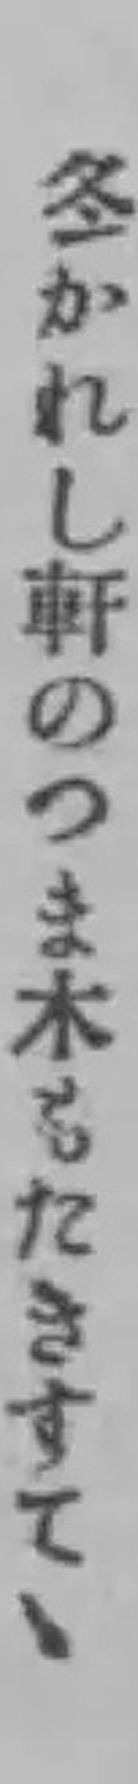冬かれし軒のつま木もたきすてゝ
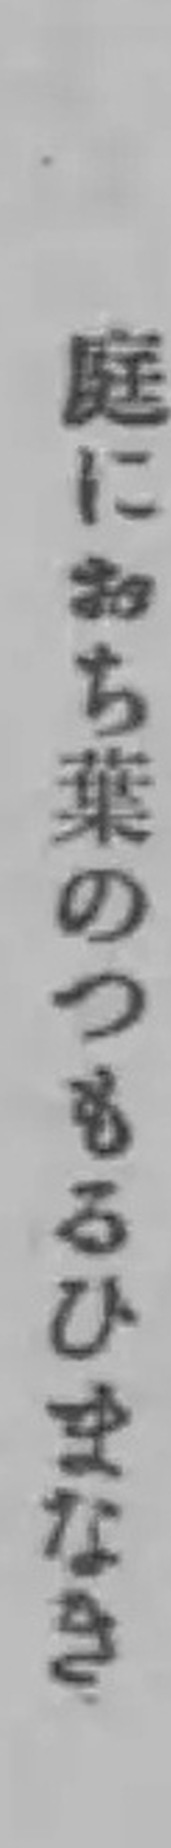庭におち葉のつもるひまなき
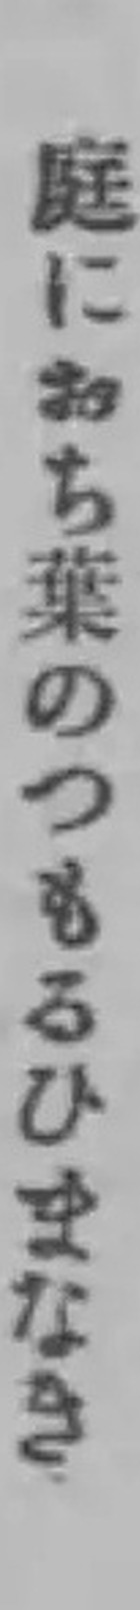庭におち葉のつもるひまなき
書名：豊橋市史談
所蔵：国立国会図書館 National Diet Library, JAPAN
